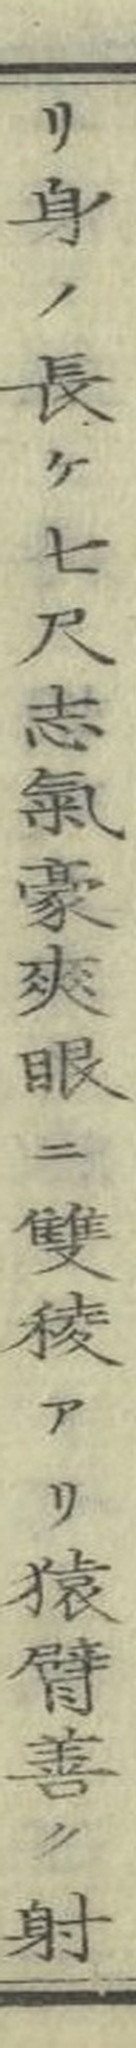リ身ノ長ケ七尺志氣豪爽眼ニ雙稜アリ猿臂善ク射
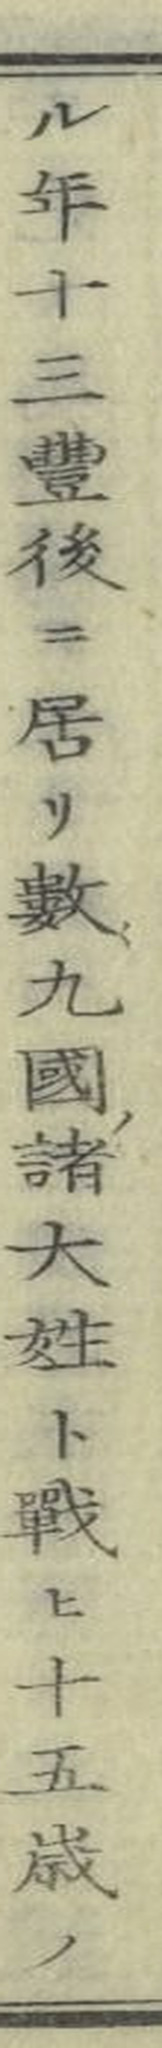ル年十三豐後ニ居リ數九國諸大姓ト戰ヒ十五歲ノ
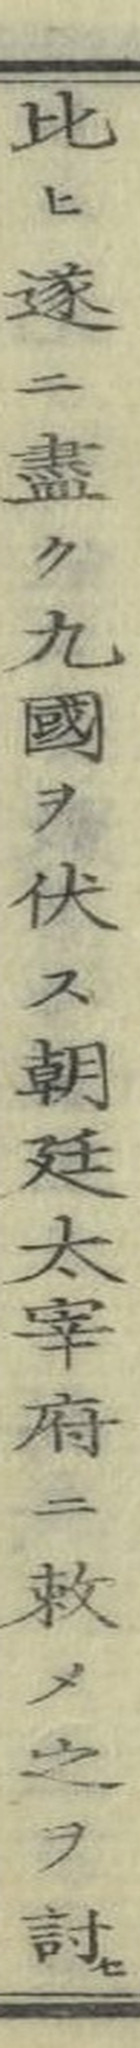比ヒ遂ニ盡ク九國ヲ伏ス朝廷太宰府ニ敕シテ之ヲ討

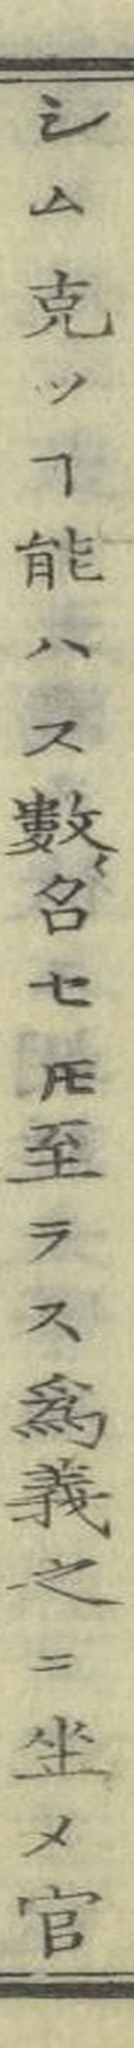シム克ツコト能ハス數〻召セトモ至タス爲義之ニ坐シテ官
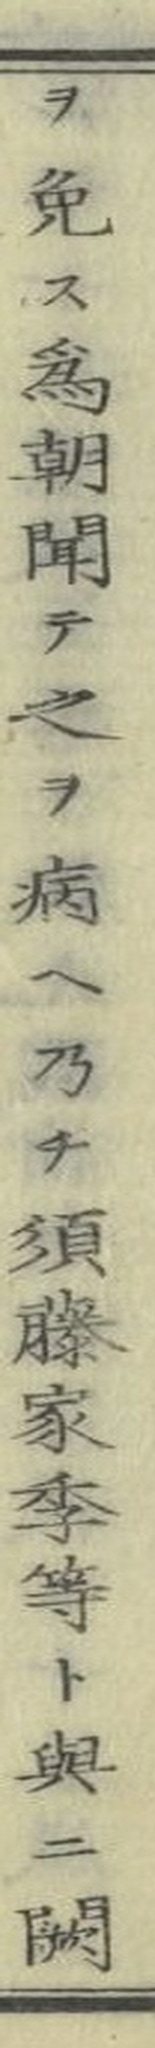ヲ免ス爲朝聞テ之ヲ病ヘ乃チ須藤家季等ト與ニ闕
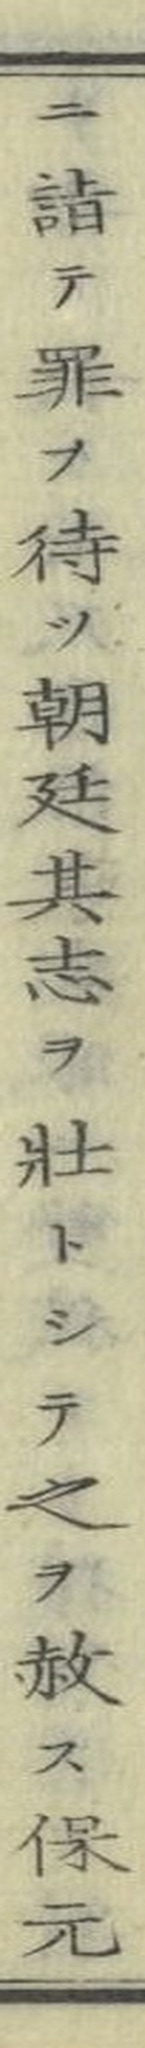ニ詣テ罪ヲ待ツ朝廷共志ヲ壯トシテ之ヲ赦ス保元
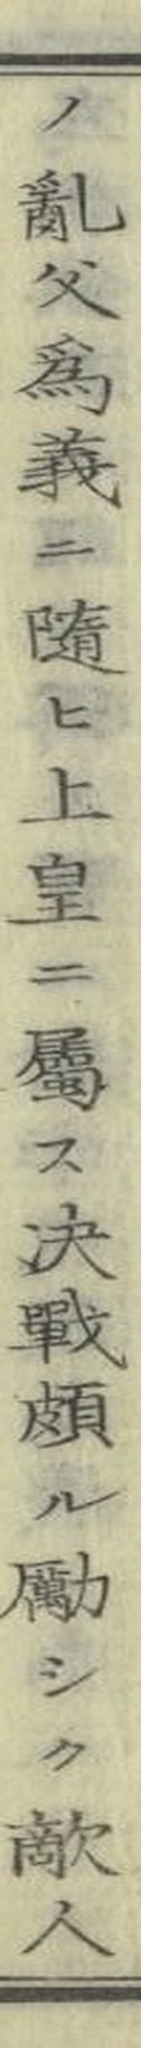ノ亂父爲義ニ隨ヒ上皇ニ屬ス決戰頗ル勵シク歒人
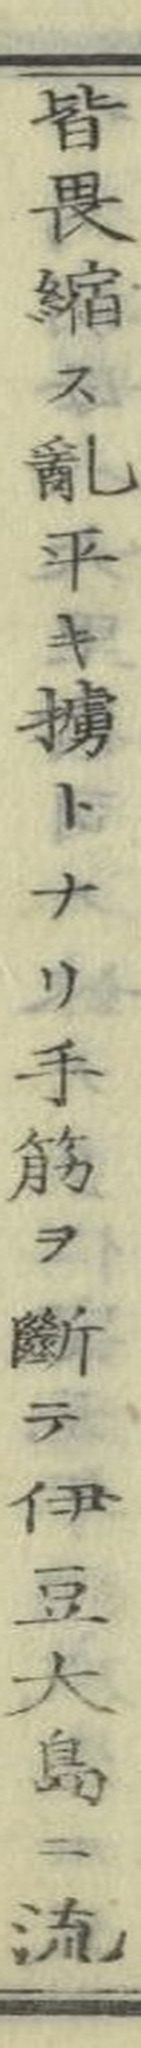皆畏縮ス亂平キ擄トナリ手筋ヲ斷テ伊豆大島ニ流
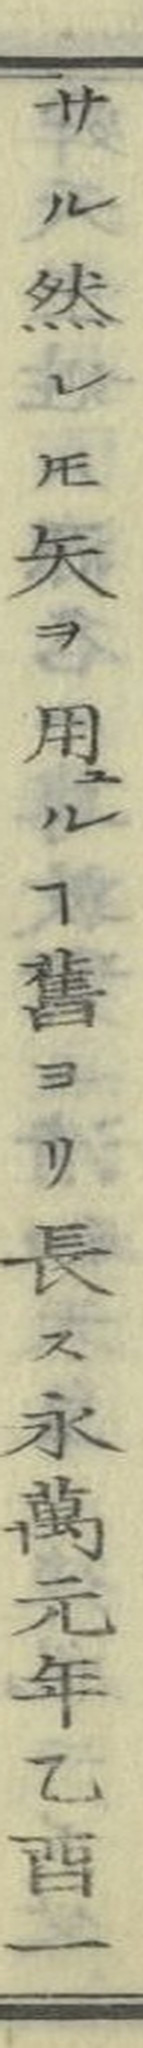サル然レトモ矢ヲ用ルコト舊ヨリ長ス永萬元年乙酉一
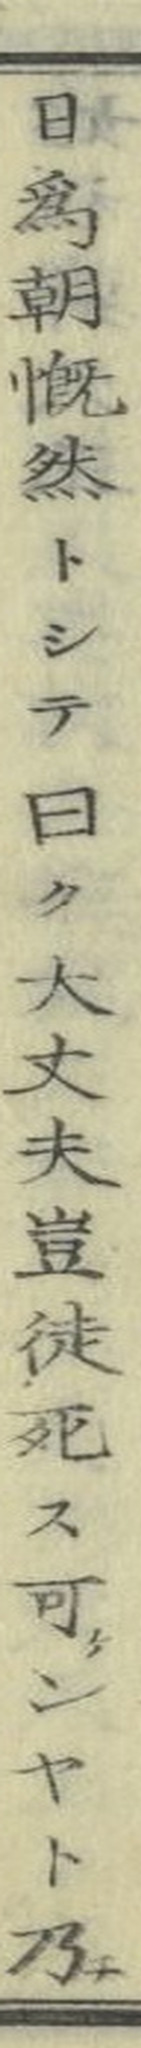日爲朝慨然トシテ曰ク大丈夫豈徒死ス可ンヤト乃
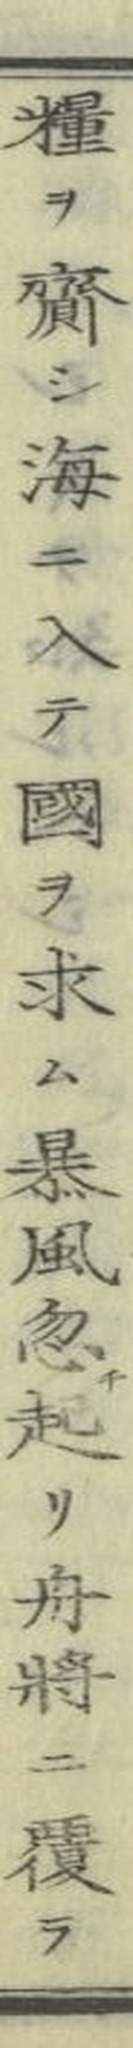糧ヲ齎シ海ニ入テ國ヲ求ム暴風忽起リ所舟將ニ覆ラ
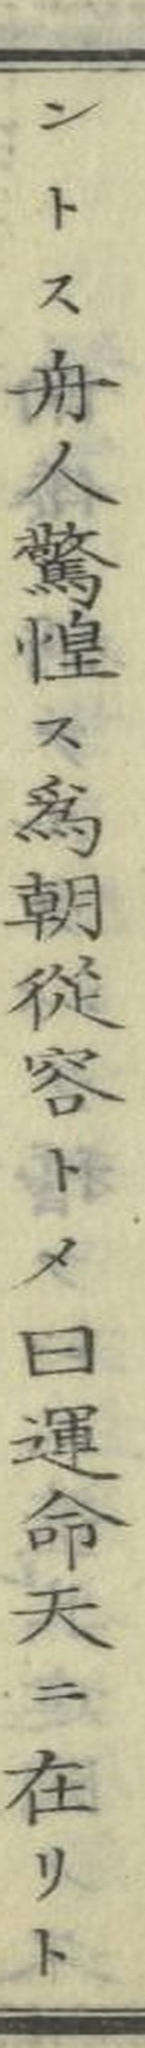ントス舟人驚惶ス爲朝從容卜シテ曰運命天ニ在リト
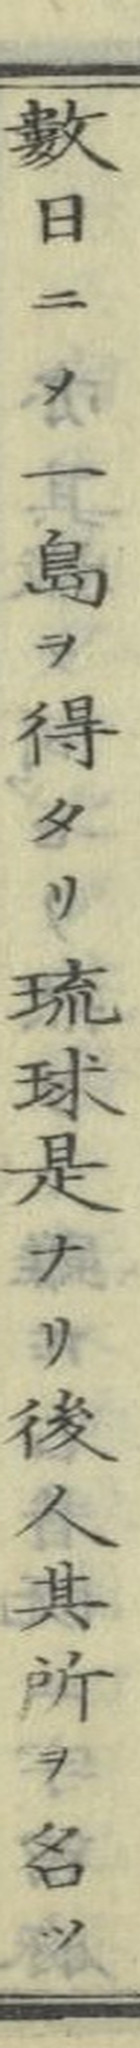數日ニシテ一島ヲ得タリ琉球是ナリ後人共所ヲ名ツ
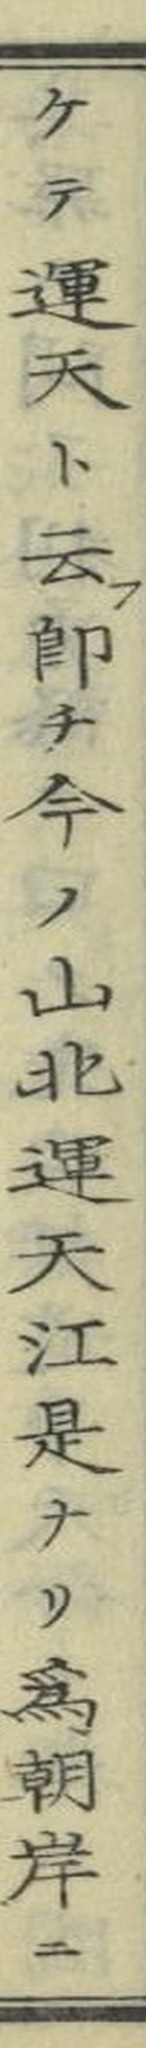ケテ運天ト云即チ今ノ山北運天江是ナリ爲朝岸ニ
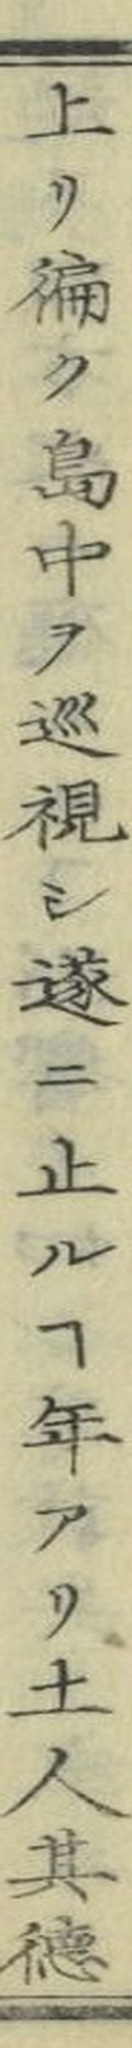上リ徧ク島中ヲ巡視シ遂ニ止ルコト年アリ土人其德
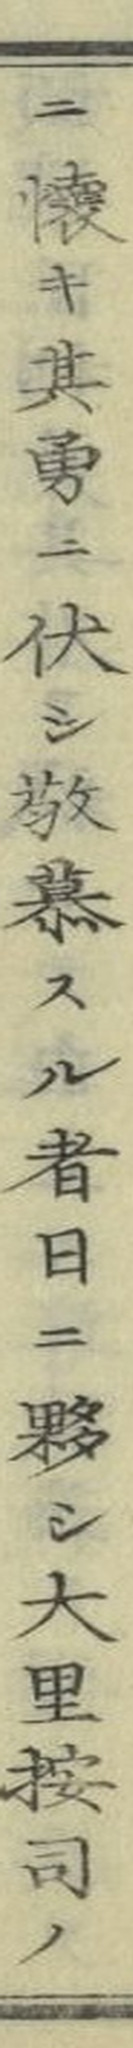ニ懐キ其勇ニ伏シ敬慕スル者日ニ夥シ大里按司ノ
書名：琉球藩史 一之巻
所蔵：University of the Ryukyus Library
